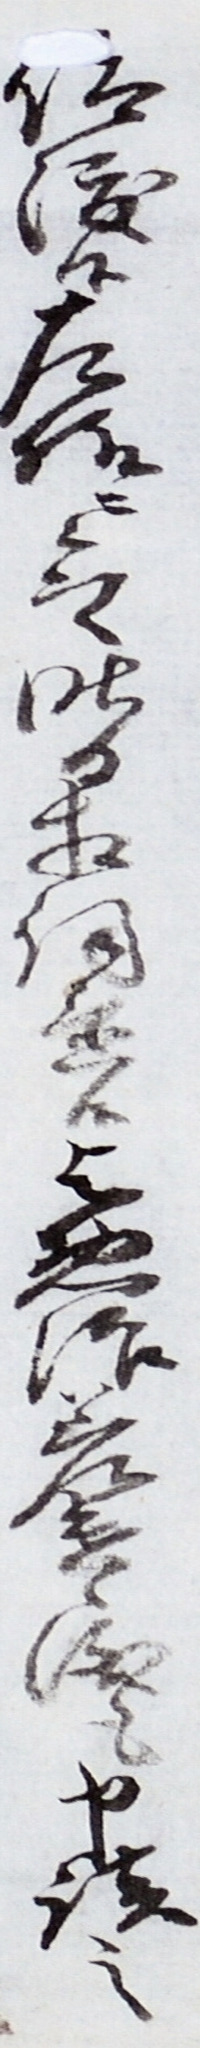仰渡候左様ニ候はゝ昨日相伺達候先惣治差置候儀も申談之
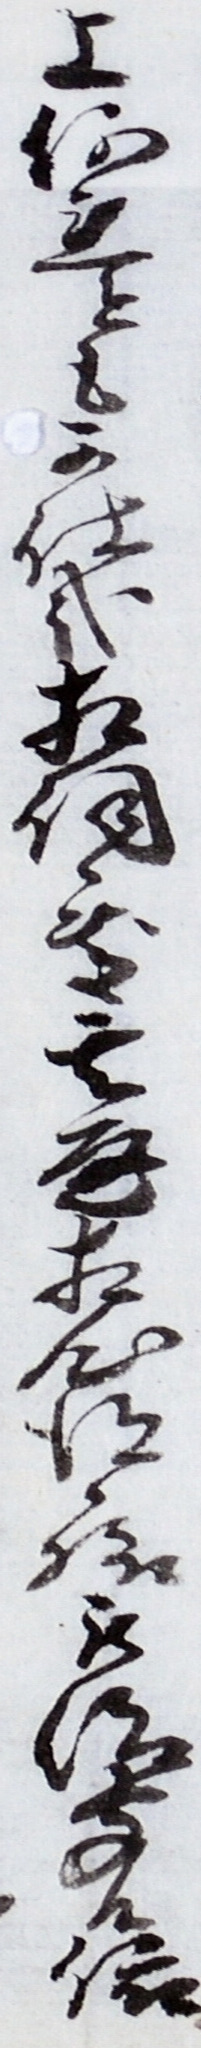上何れとも可仕哉相伺候処其通相心得候様被仰聞候依
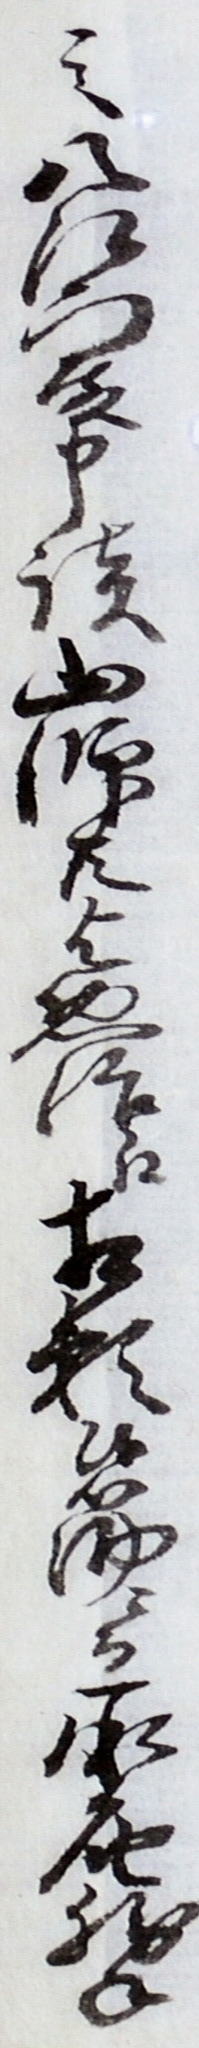之八左衛門殿申談山師共与惣治江相頼候筋ニ而承置勝手
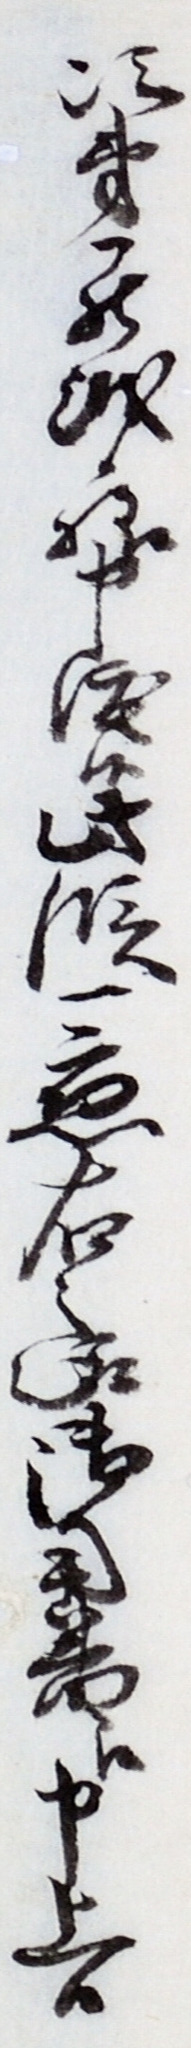次第罷越候様申渡候此段一応右之趣御用番え申上候
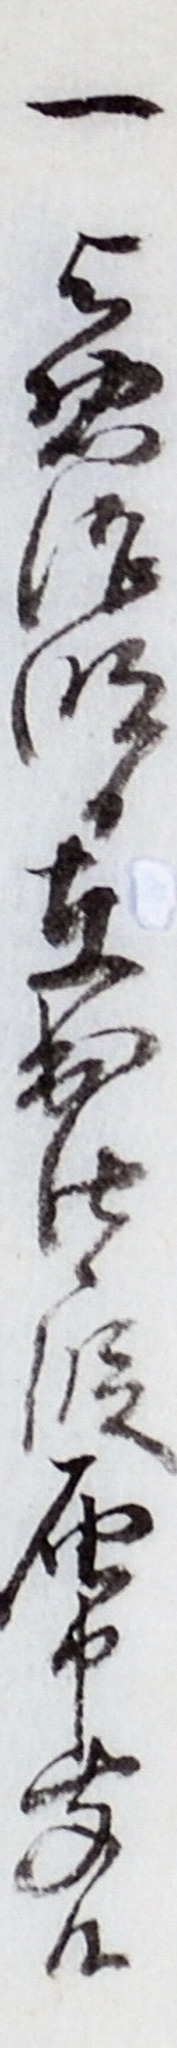一与惣治明日在出仕候段届申聞候
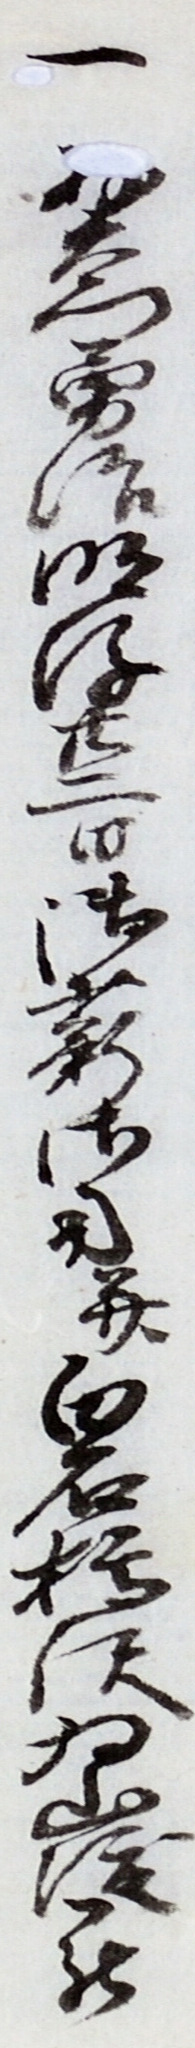一右衛門勇治明後廿二日御薪御用并白石樽沢為山凌罷
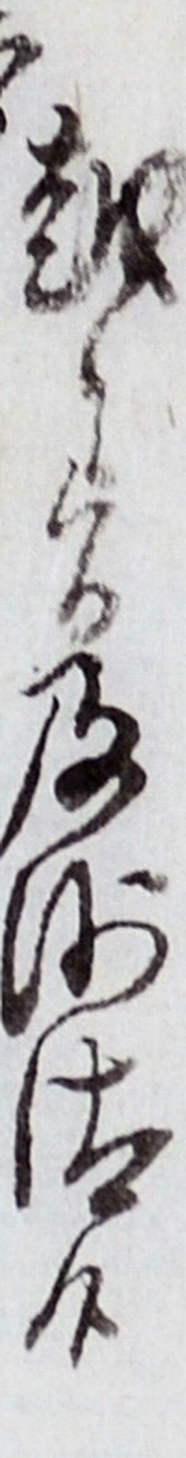越候旨及沙汰候
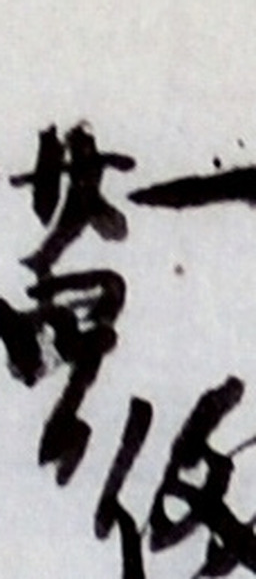廿四日
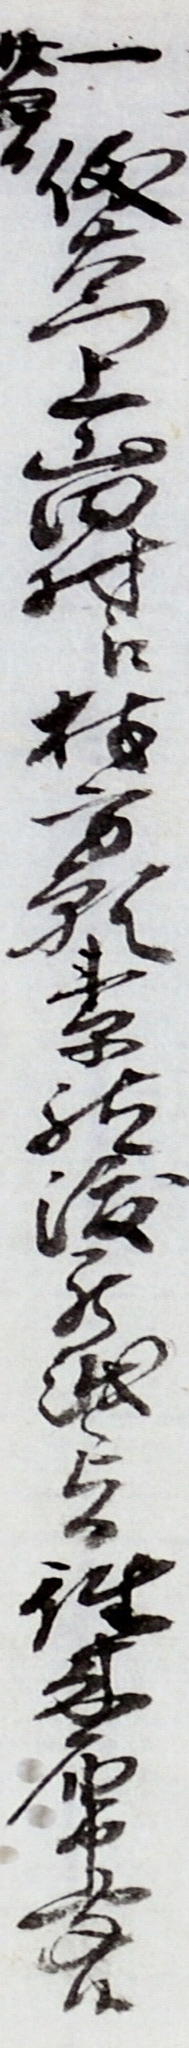一儀右衛門上山田村江村方願書駄渡罷越候旨往来届申聞候
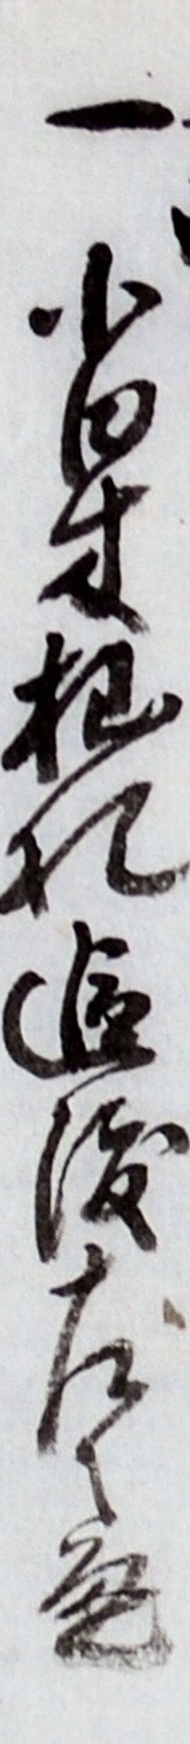一小白木杣札追渡左之通
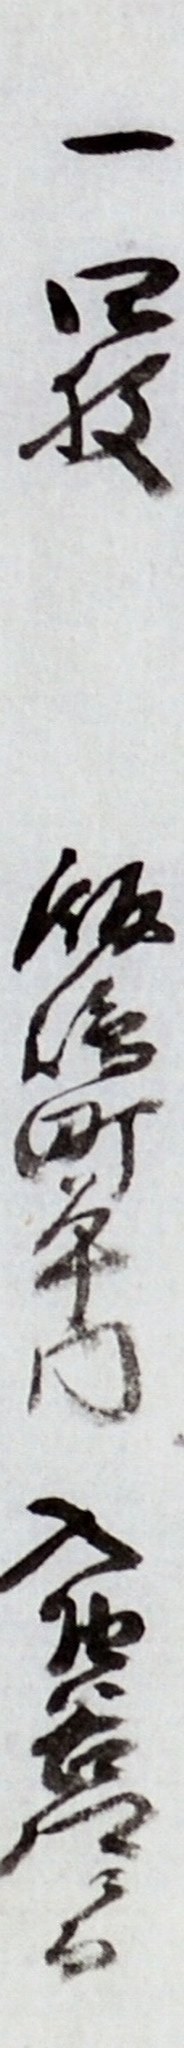一四枚飯嶋町平内入野谷郷ニ而
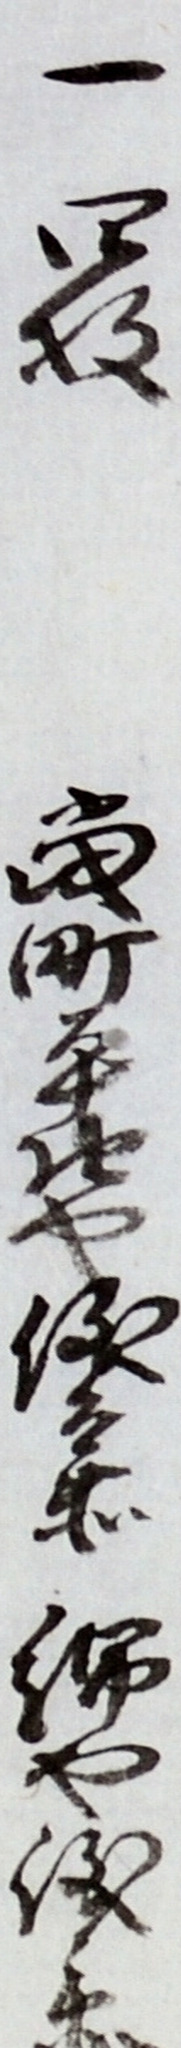一四枚当町平野や儀兵衛綿や儀兵衛
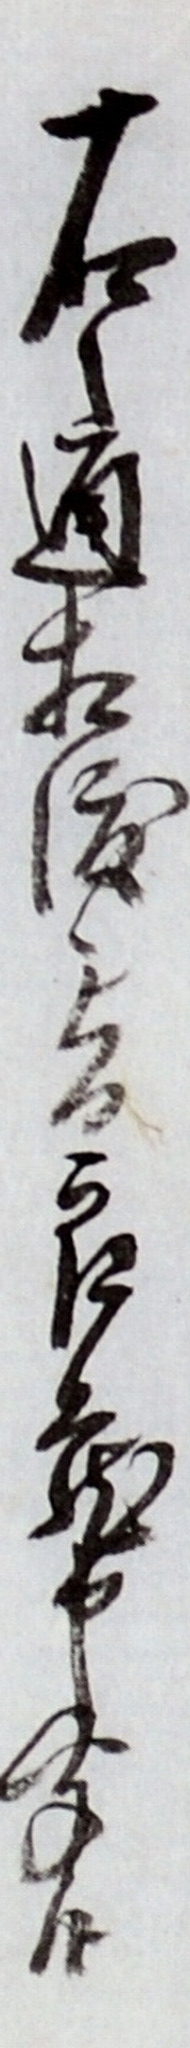右之通相渡候旨被申聞候
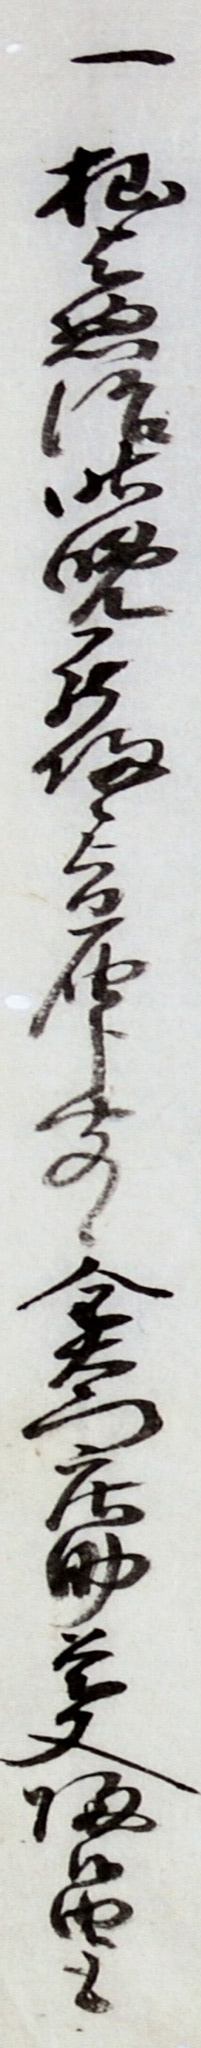一杣与惣治御覧罷帰候旨届申聞候金右衛門庄助是又帰候由も

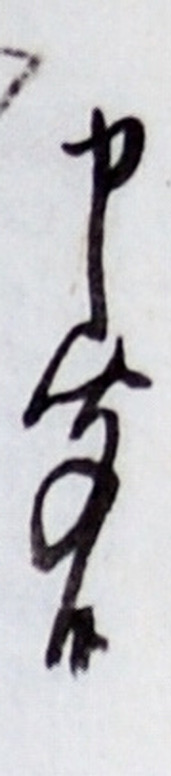申聞候
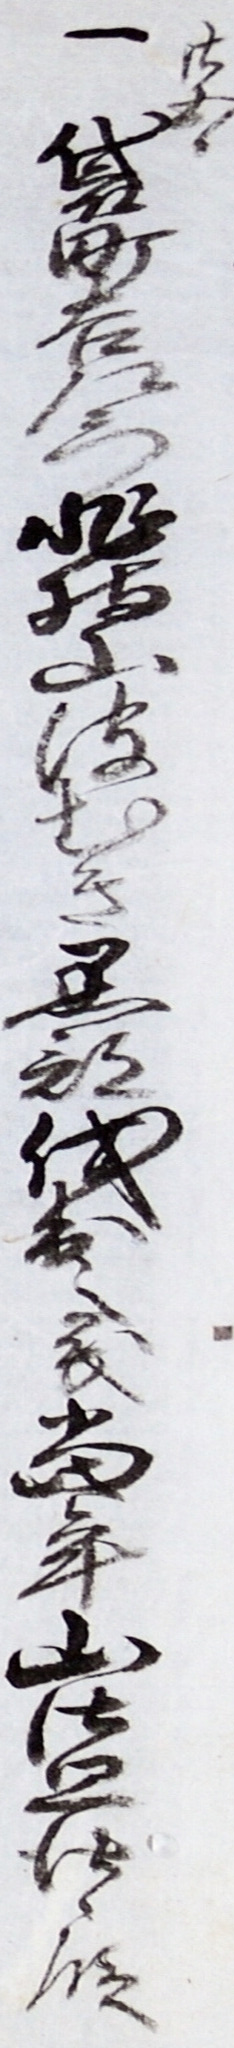一袋町吉左衛門非持山波むき黒部伐出之義当年山仕廻仕候段
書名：御山奉行御用控
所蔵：伊那市立高遠町図書館・合同会社AMANE
